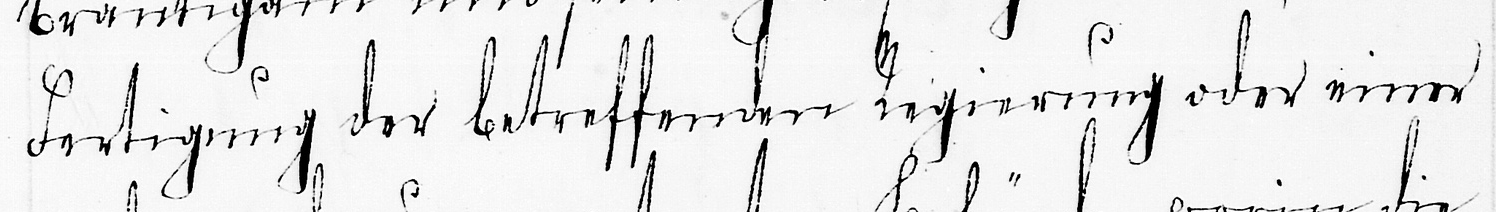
Fertigung der betreffenden Regierung oder einer
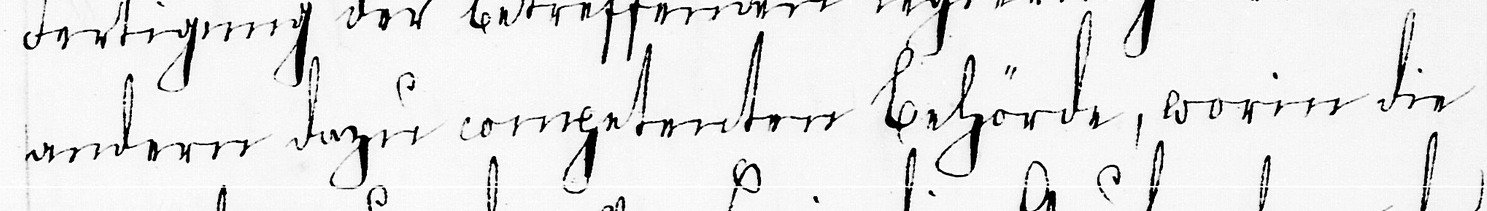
andern dazu competenten Behörde, worin die
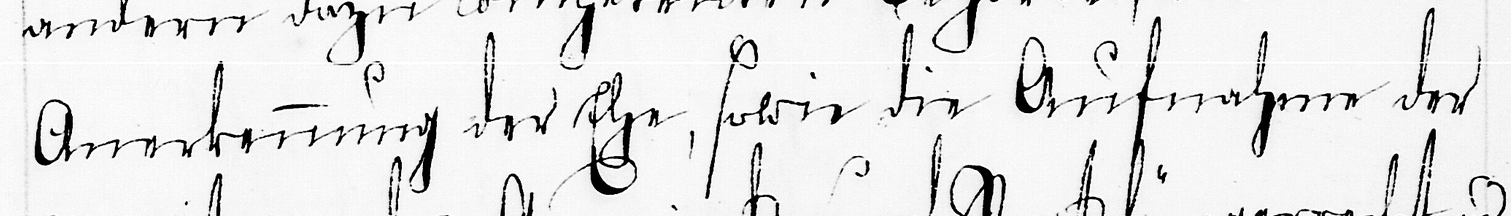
Anerkennung der Ehe, sowie die Aufnahme der
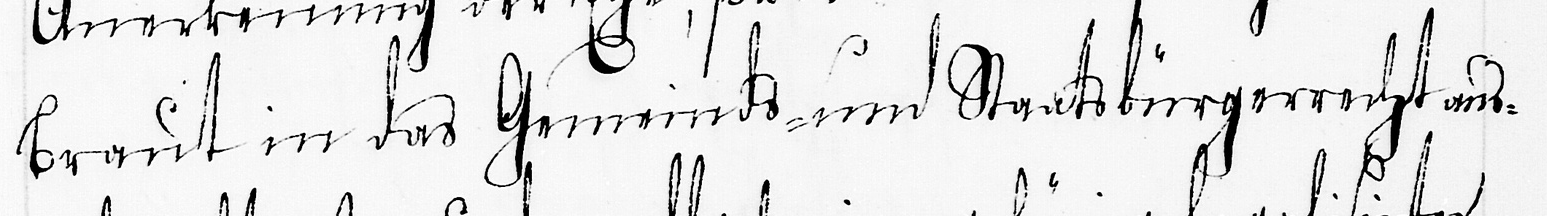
Braut in das Gemeinds- und Staatsbürgerrecht aus¬
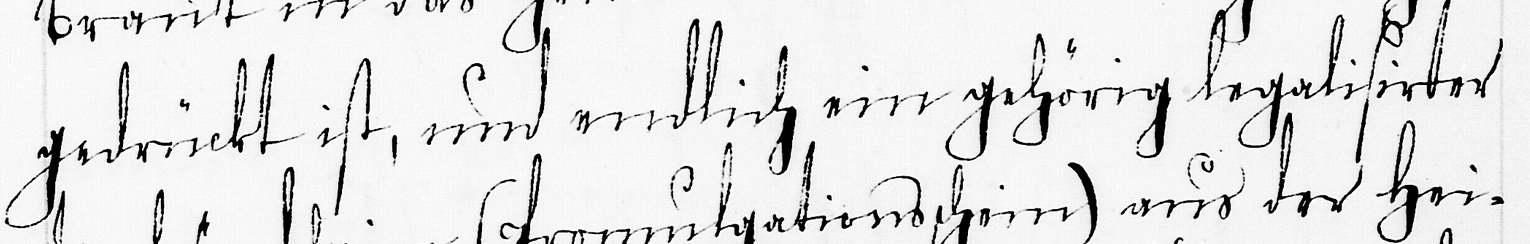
gedrückt ist, und endlich ein gehörig legalisirter
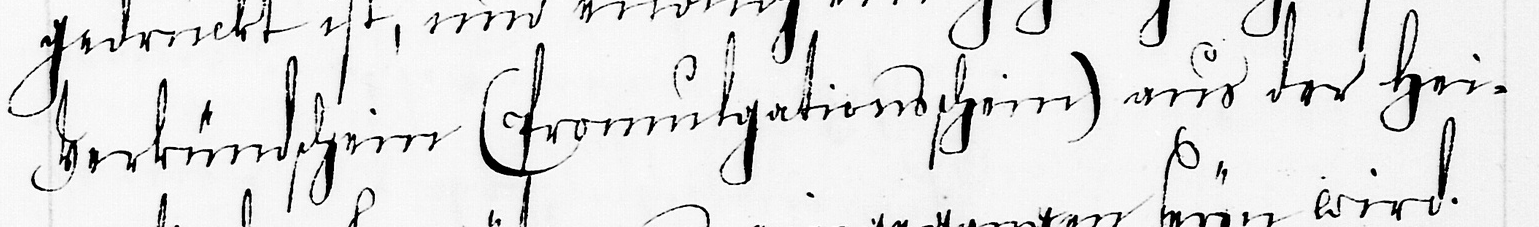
Verkündschein (Promulgationsschein) aus der Hei¬
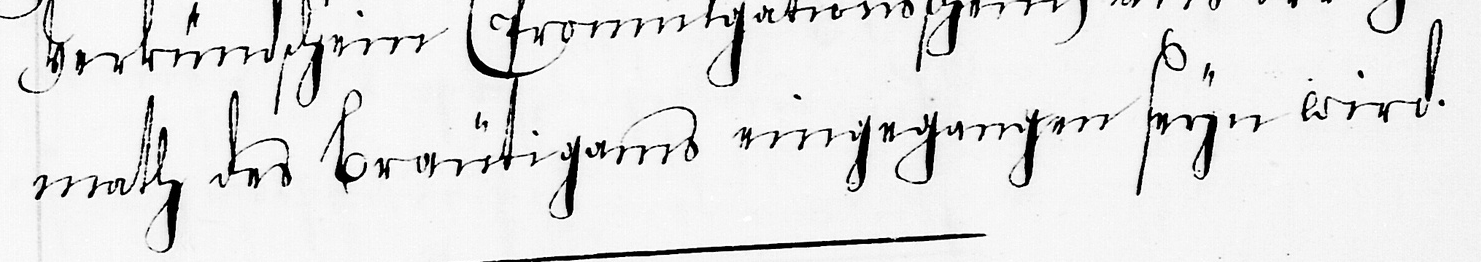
math des Bräutigams eingegangen seyn wird.
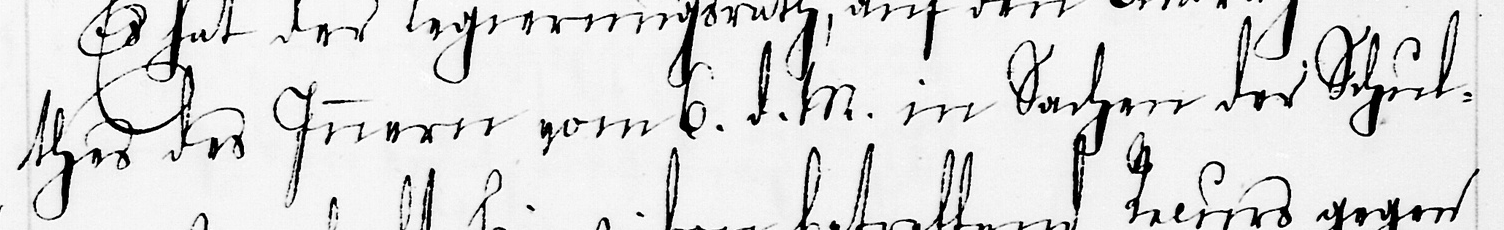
thes des Innern vom 6. d. M. in Sachen der Schul¬
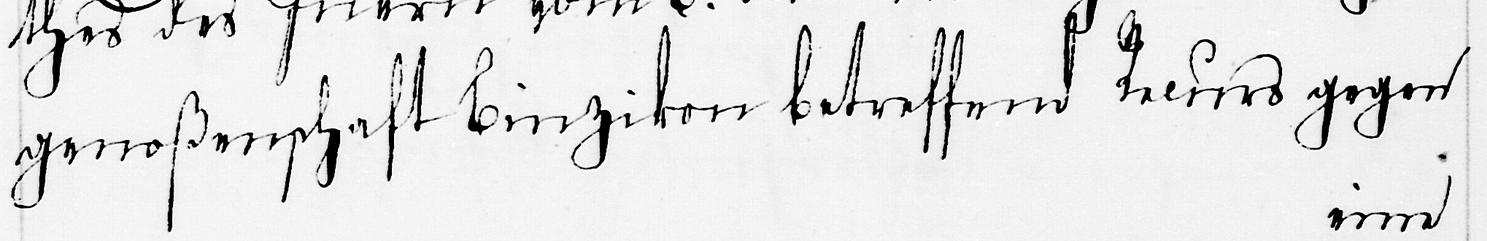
genoßenschaft Binzikon betreffend Recurs gegen
